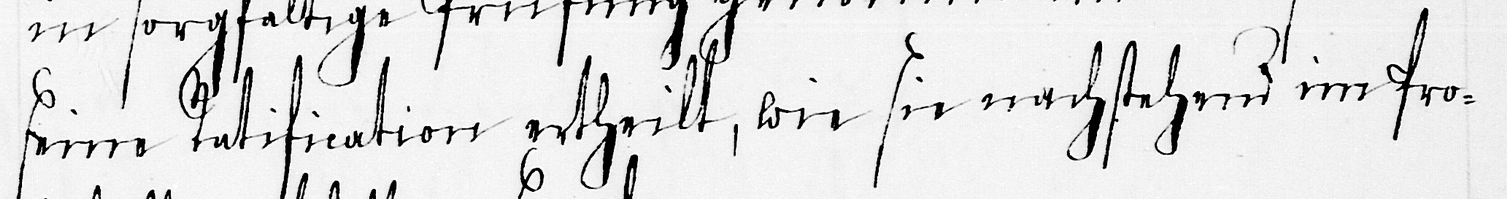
seine Ratification ertheilt, wie sie nachstehend im Pro¬
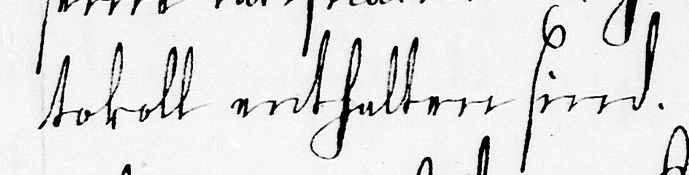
tokoll enthalten sind.
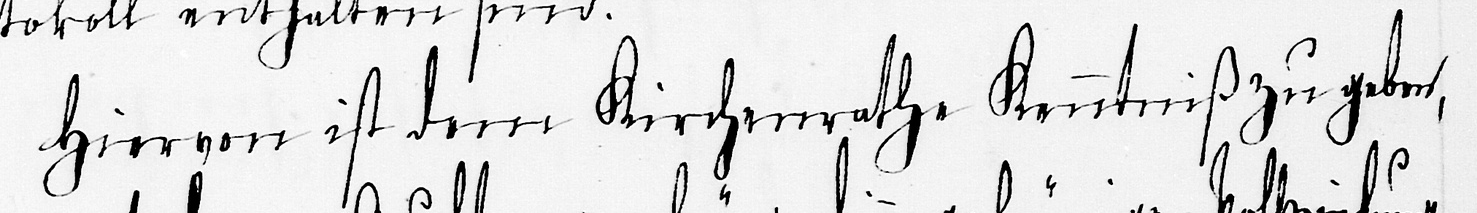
Hiervon ist dem Kirchenrathe Kenntniß zu geben,
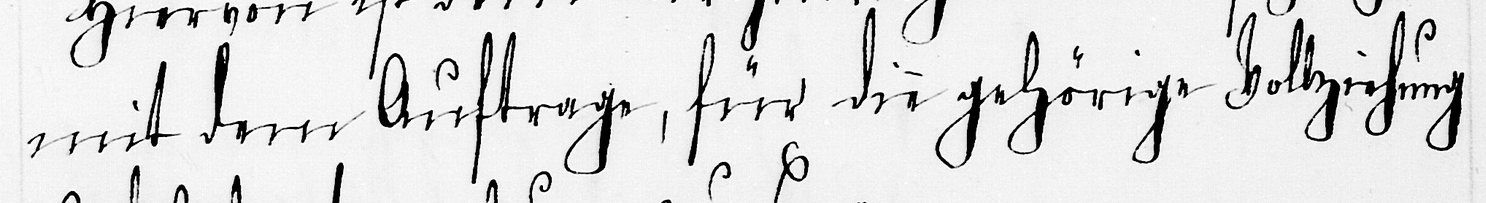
mit dem Auftrage, für die gehörige Vollziehu¬
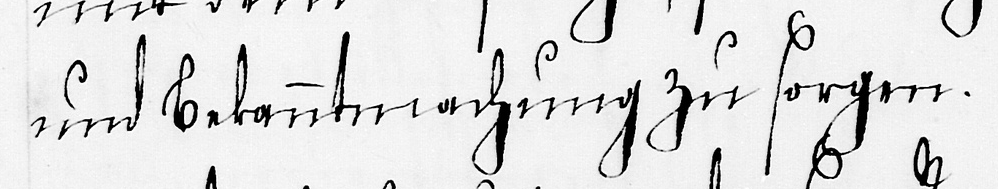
und Bekanntmachung zu sorgen.
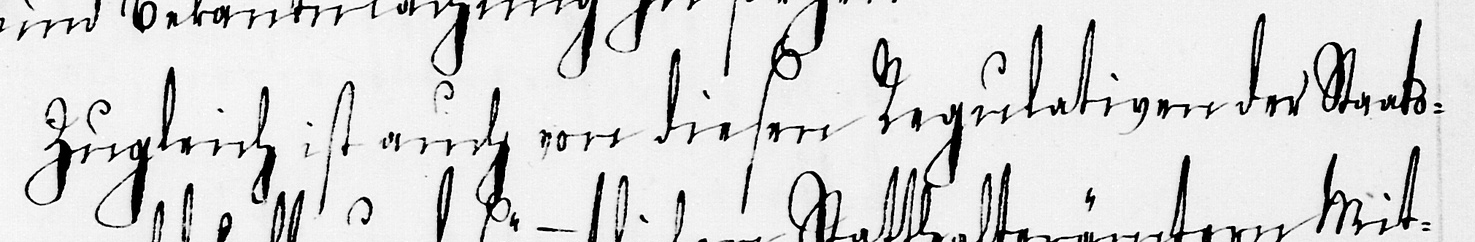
Zugleich ist auch von diesen Regulativen der Staat¬
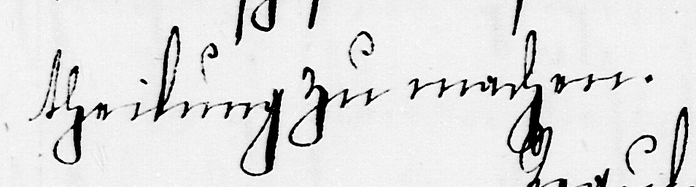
theilung zu machen.
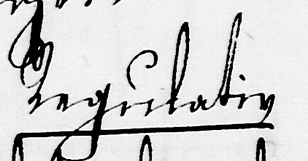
Regulativ
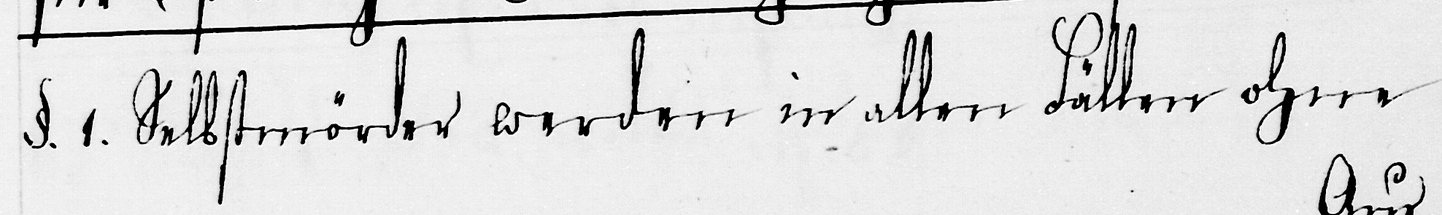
1. Selbstmörder werden in allen Fällen ohne
